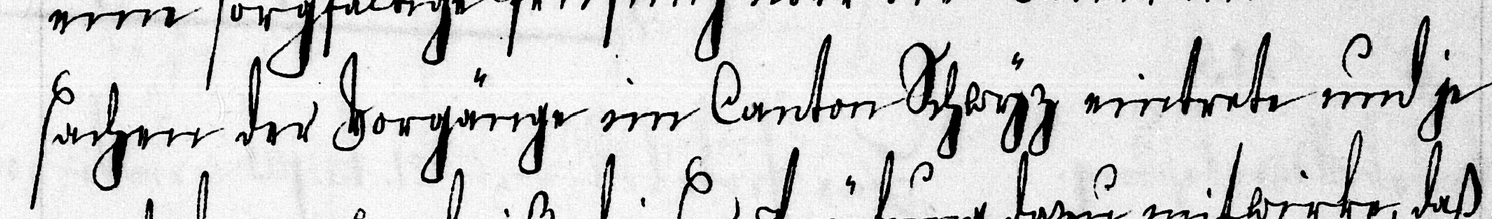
sachen der Vorgänge im Canton Schwyz eintrete und je
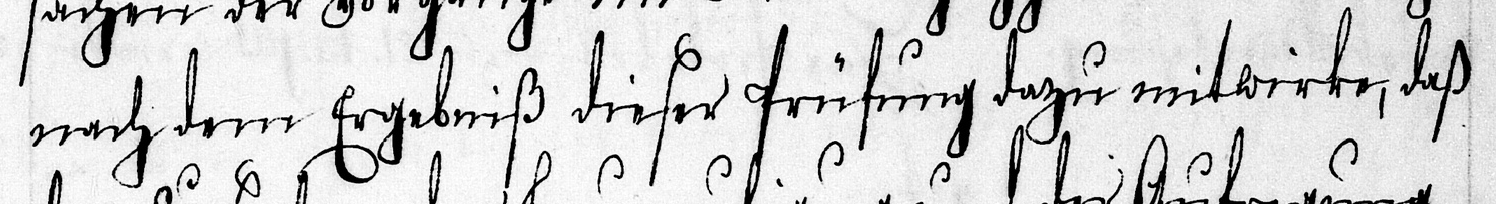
nach dem Ergebniß dieser Prüfung dazu mitwirke, daß
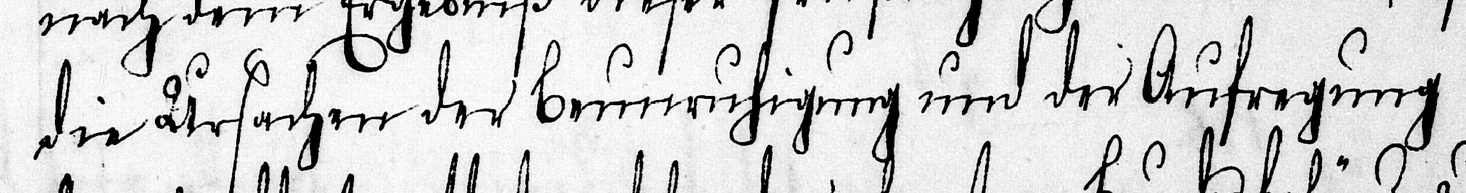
die Ursachen der Beunruhigung und der Aufregung
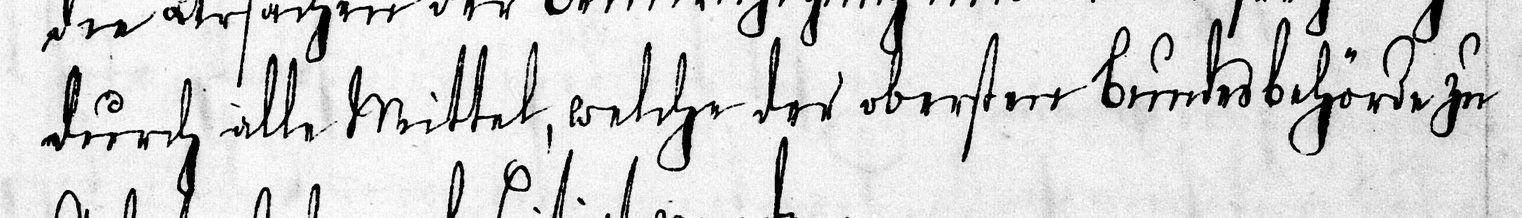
durch alle Mittel, welche der obersten Bundesbehörde zu
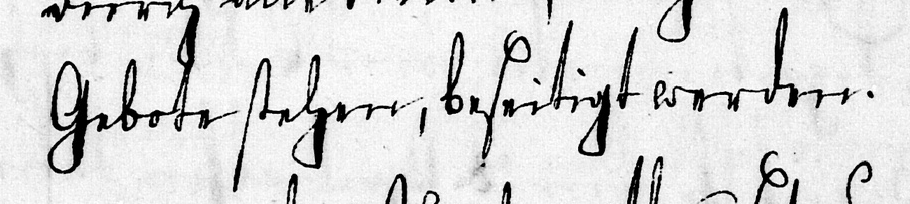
Gebote stehen, beseitigt werden.
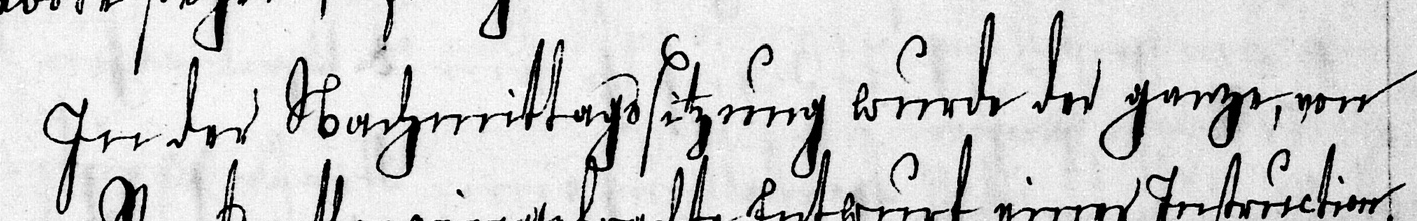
In der Nachmittagssitzung wurde der ganze, von
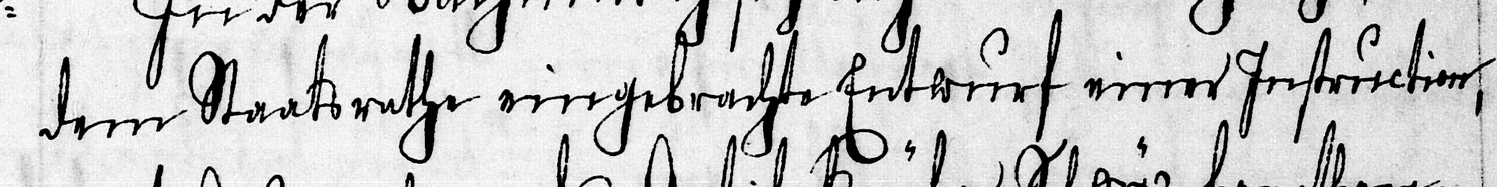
dem Staatsrathe eingebrachte Entwurf einer Instruction,
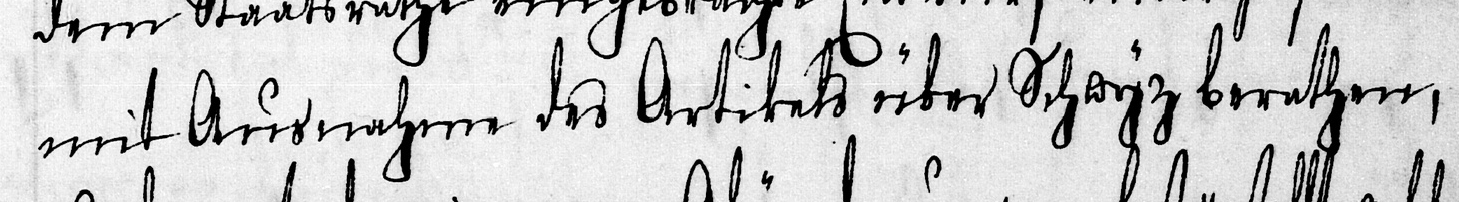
mit Ausnahme des Artikels über Schwyz berathen,
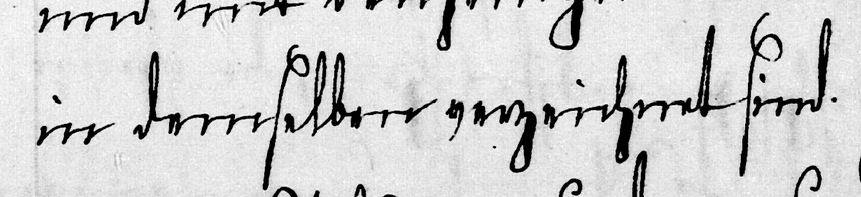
in demselben verzeichnet sind.
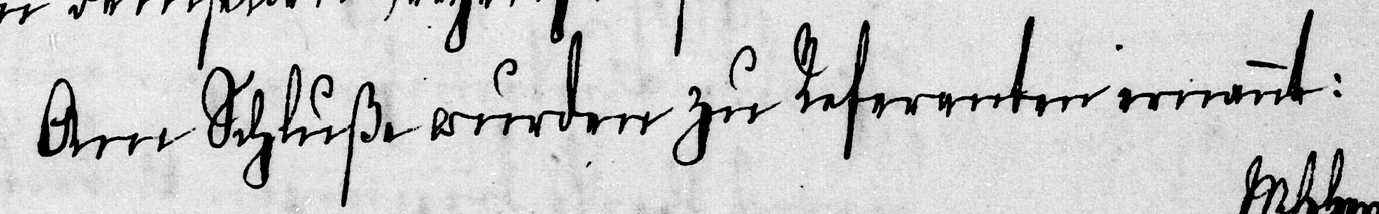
Am Schluße wurden zu Referenten ernannt:
